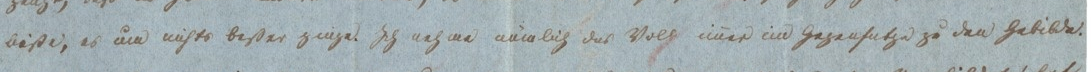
ließe, es um nichts besser ginge. Ich nehme nämlich das Volk immer im Gegensatze zu den Gebilde-
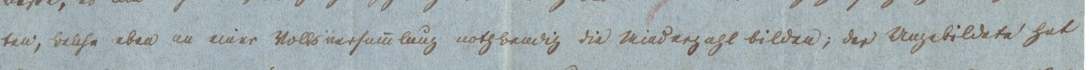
ten, welche eben an einer Volksversammlung nothwendig die Minderzahl bilden; der Ungebildete hat
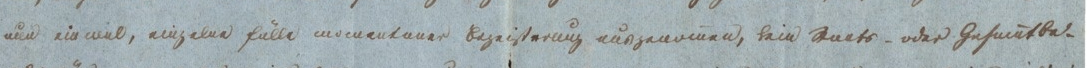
nun einmal, einzelne Fälle momentaner Begeisterung ausgenommen, kein Staats- oder Gesammtbe-
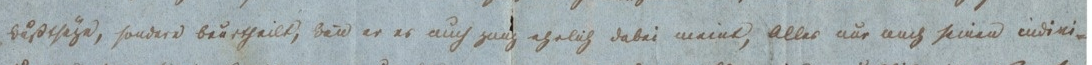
wußtseyn, sondern beurtheilt, wenn er es auch ganz ehrlich dabei meint, Alles nur nach seinen indivi-
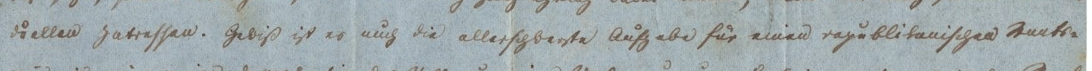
duellen Intressen. Gewiß ist es auch die allerschwerste Aufgabe für einen republikanischen Staats-
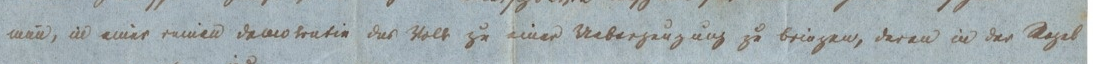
mann, in einer reinen Demokratie das Volk zu einer Ueberzeugung zu bringen, deren in der Regel
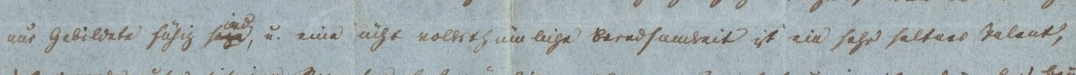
nur Gebildete fähig seynind, u. eine ächt volksthümliche Beredsamkeit ist ein sehr seltnes Talent,
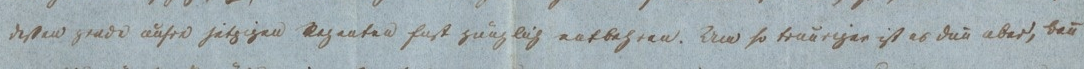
dessen grade unsre jetzigen Regenten fast gänzlich entbehren. Um so trauriger ist es dann aber, wenn
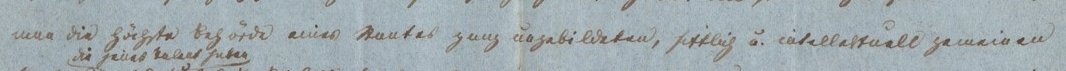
man die höchste Behörde eines Staates ganz ungebildeten, sittlich u. intellektuell gemeinen
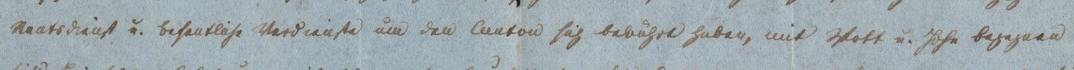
Staatsdienst u. wesentliche Verdienste um den Canton sich bewährt haben, mit Spott u. Hohn begegnen
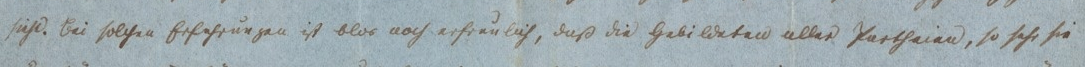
sieht. Bei solchen Erfahrungen ist blos noch erfreulich, daß die Gebildeten aller Partheien, so sehr sie
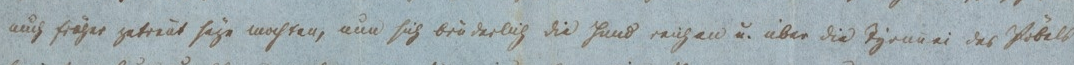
auch früher getrennt seyn mochten, nun sich brüderlich die Hand reichen u. über die Tyrannei des Pöbels
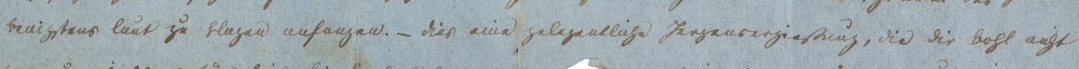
wenigstens laut zu klagen anfangen. – Dies eine gelegentliche Herzensergießung, die Dir wohl nicht
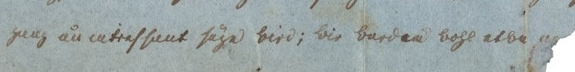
ganz unintressant seyn wird; wir werden wohl etwa
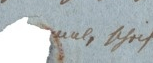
ein andermal,
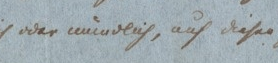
oder mündlich, auf diesen
